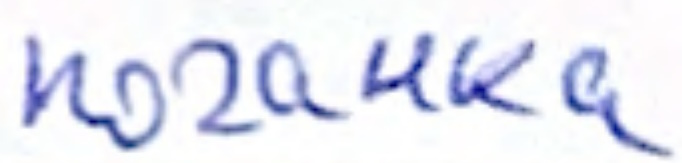поганка
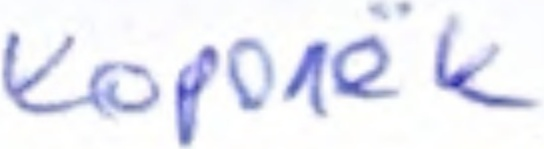королёк
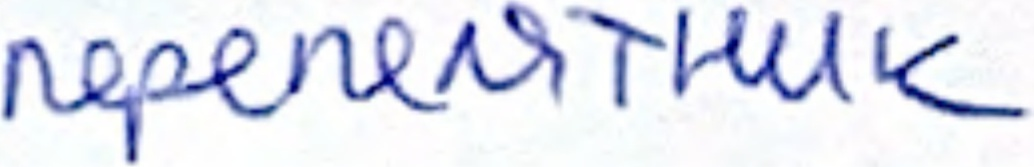перепелятник
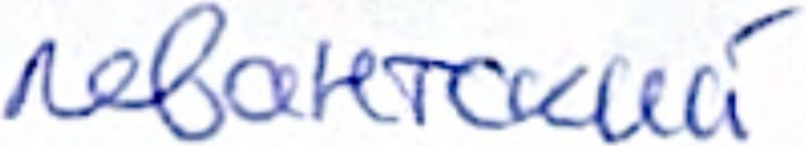левантский
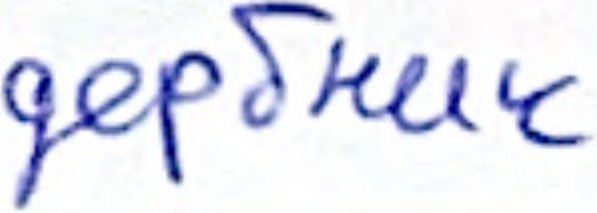дербник
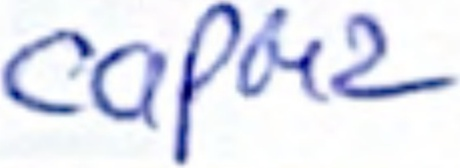сарыч
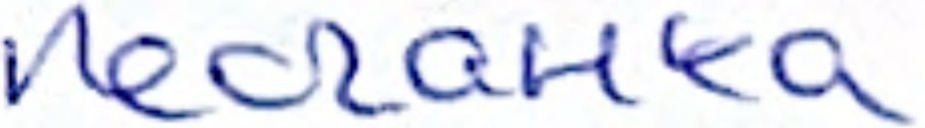песчанка
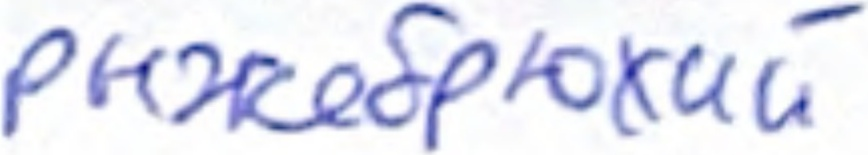рыжебрюхий
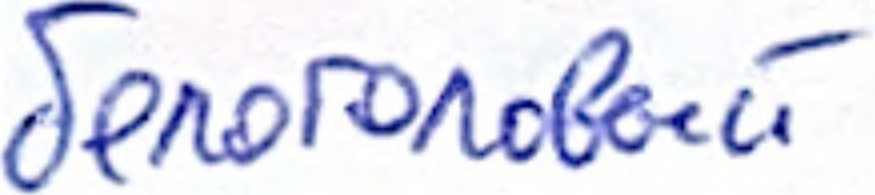белоголовый
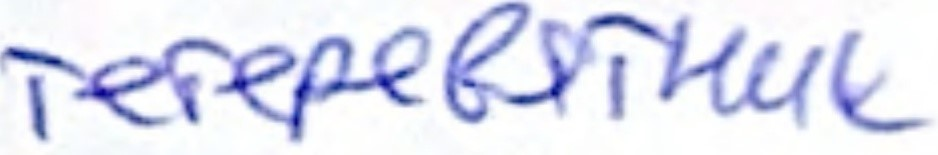тетеревятник
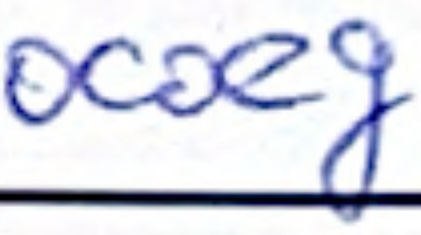осоед
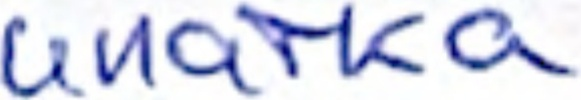ипатка
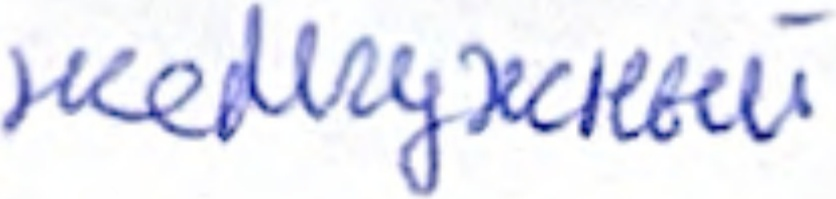жемчужный
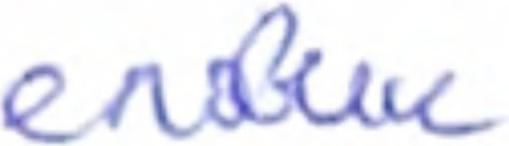еловик
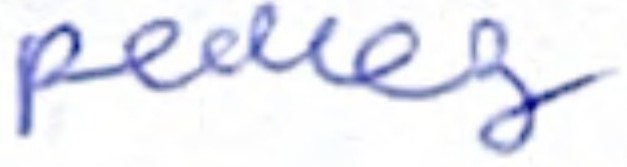ремез
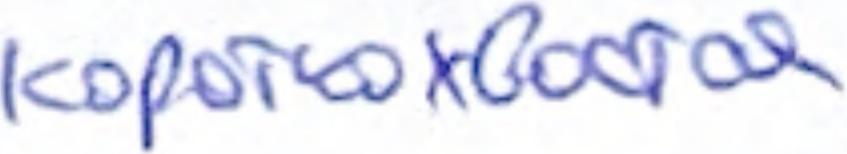короткохвостая
